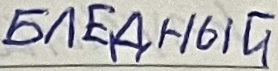бледный
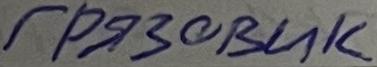грязовик
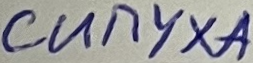сипуха
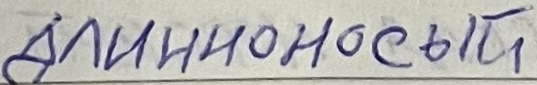длинноносый
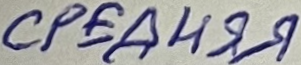средняя
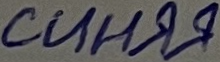синяя
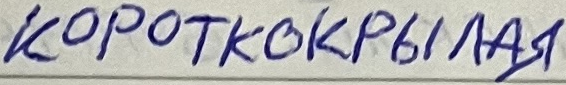короткокрылая
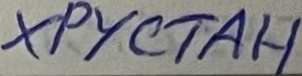хрустан
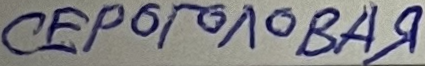сероголовая
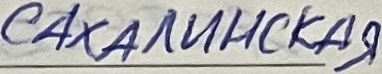сахалинская
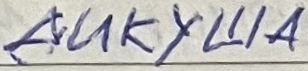дикуша
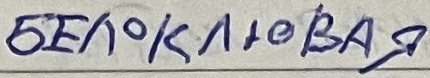белоклювая
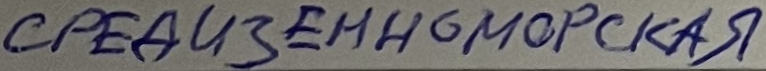средиземноморская
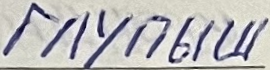глупыш
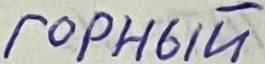горный
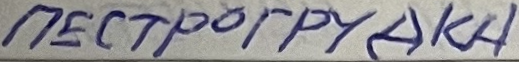пестрогрудка
